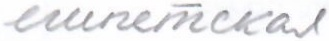египетская
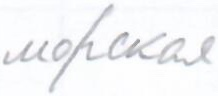морская
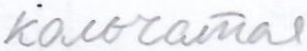кольчатая
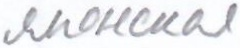японская
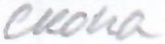скопа
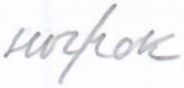нырок
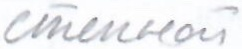степной
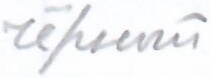чёрный
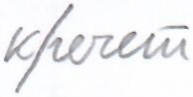кречет
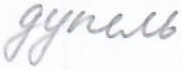дупель
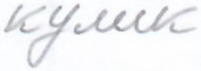кулик
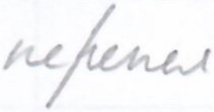перепел
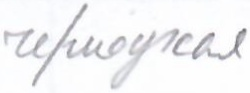черноухая
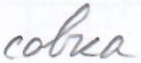совка
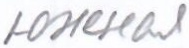южная
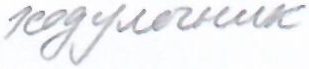ходулочник
